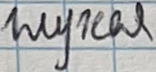глухая
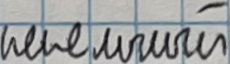пепельный
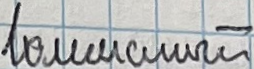волнистый
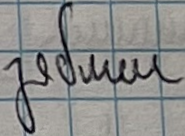зяблик
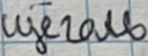щёголь
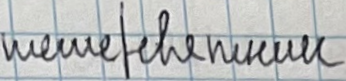тетеревятник
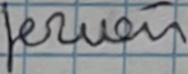речной
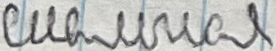скальная
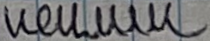кеклик
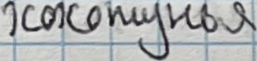хохотунья
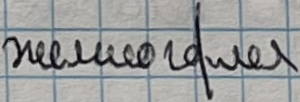желтогорлая
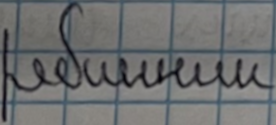рябинник
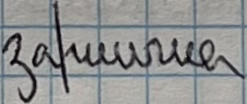зарничка
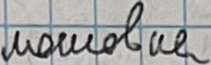московка
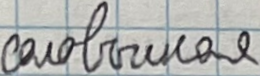соловьиная
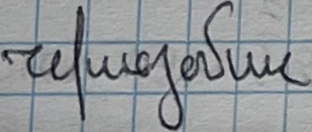чернозобик
